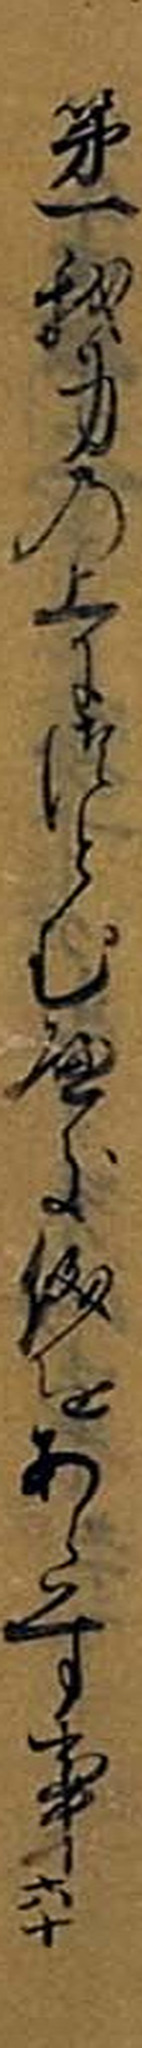第一我身の上につとむへき儀をあらはす事
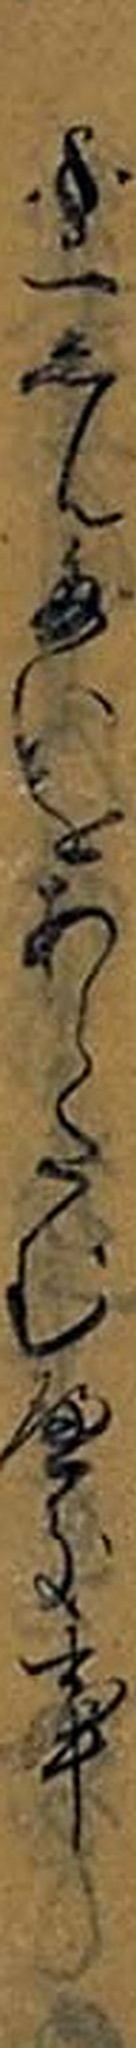§一しんたいをあらたむへき事
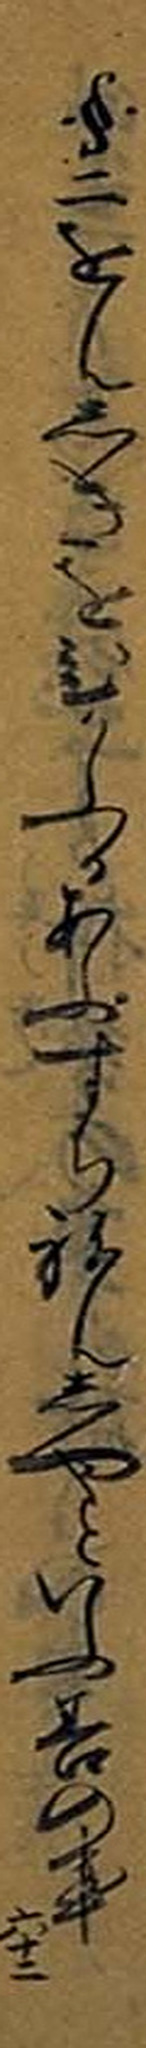§ニをんしきをひかふるあふすちねんしやといふ善の事六十二
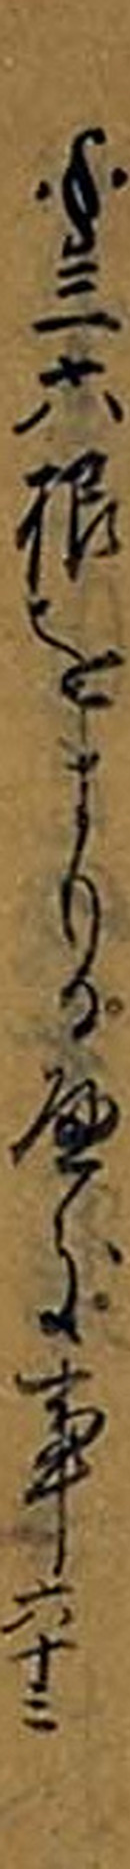§三六根をまもるへき事六十三
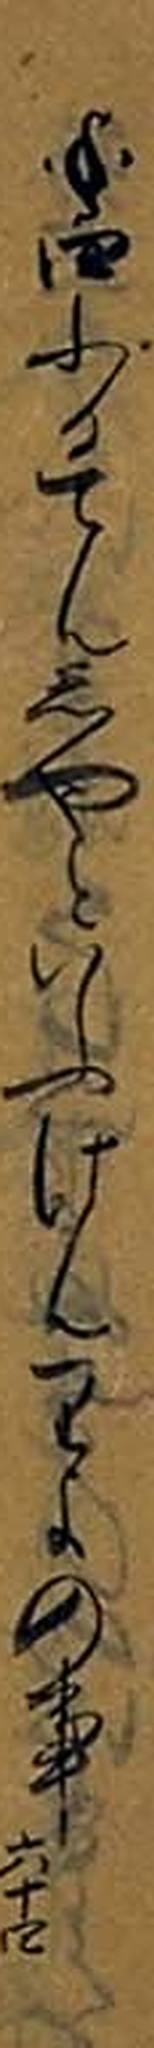§四にるてんしやといふけんりよの事六十四
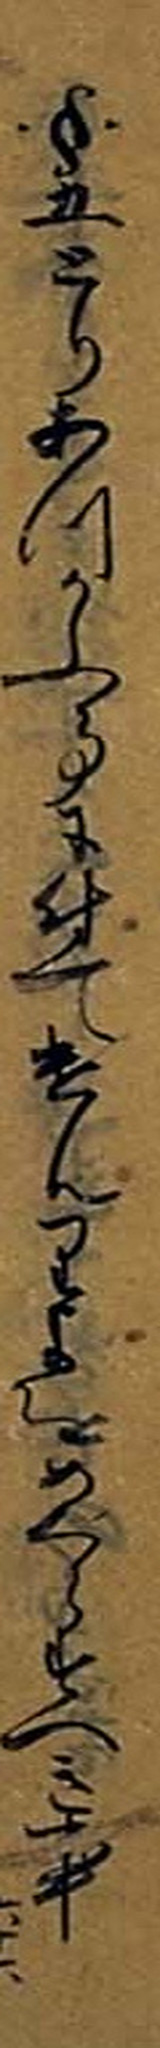§五とりあつかふ事に付てけんりよをめぐらすへき事六十六
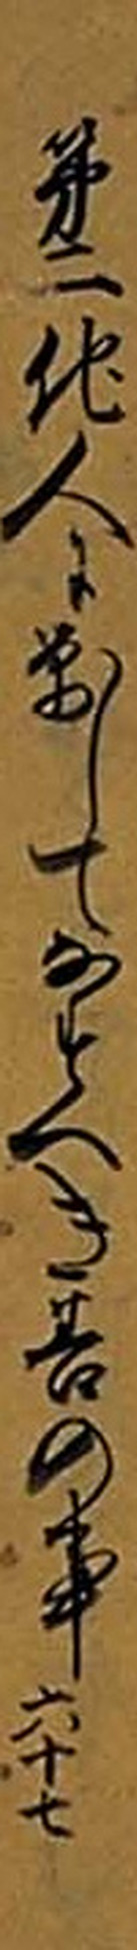第二他人に対してなすへき善の事六十七
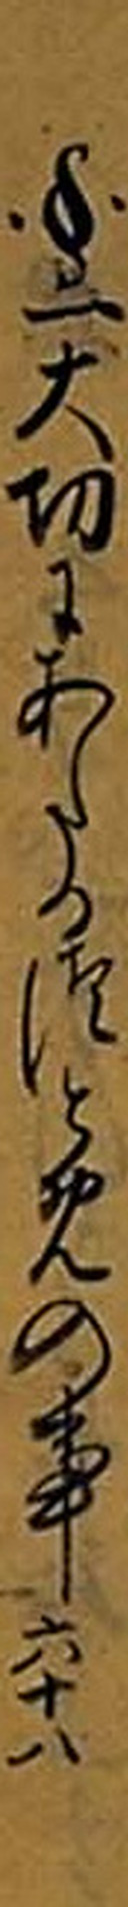§一大切にあたるつとめの事六十八
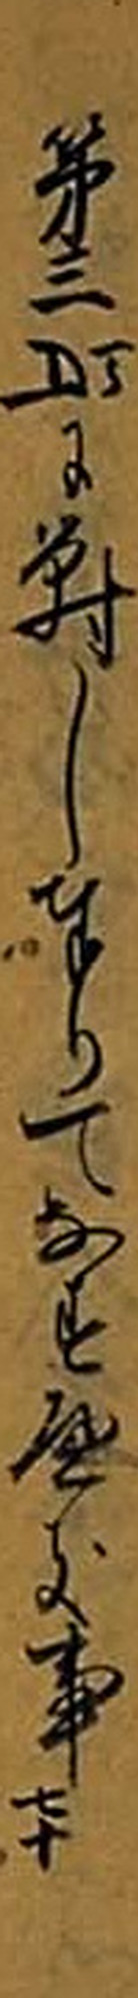第三に対し奉りてなすへき事七十
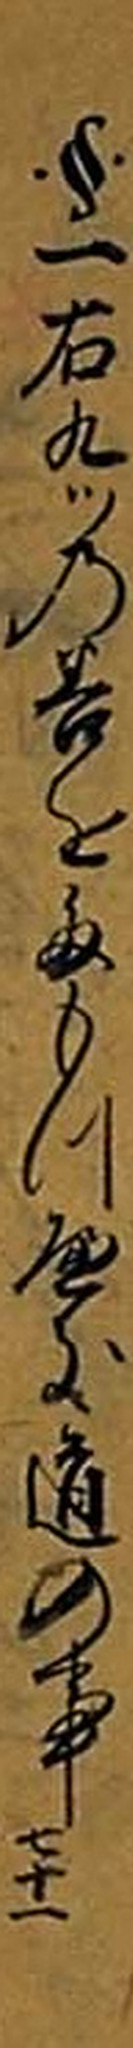§一右九ツの善をたもつへき道の事七十一
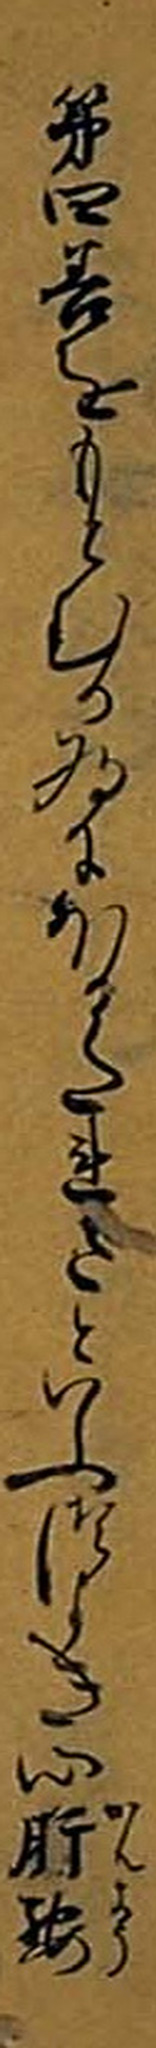第四善をもとむる為にほかたれざといふつよき心肝要
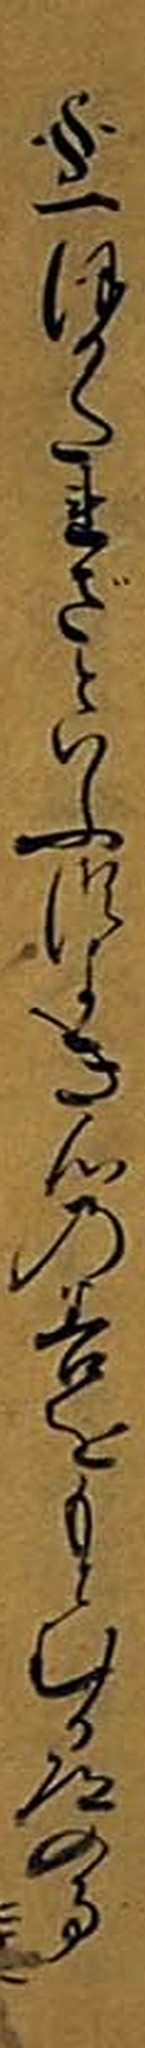§一ほかたれざといふつよき心の善をもとむる道の事七十
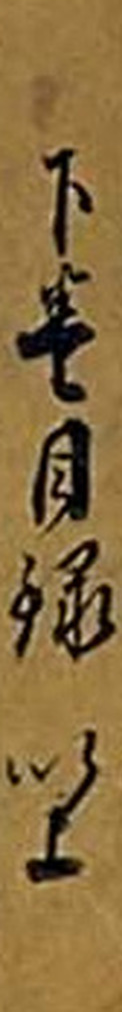下巻目録以上

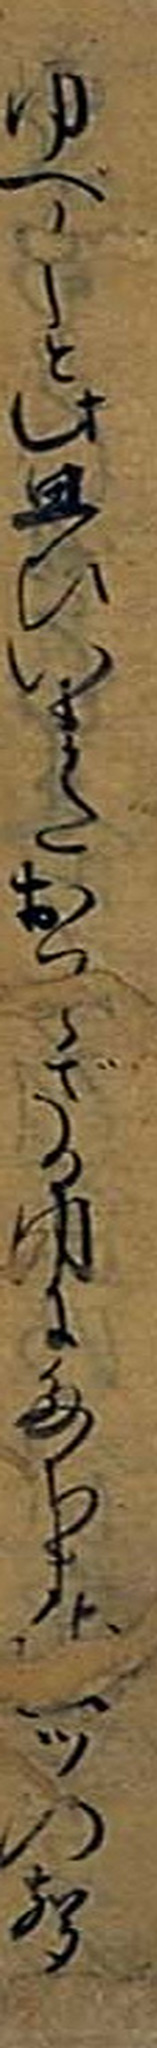ゆべしと此思ひいまたおわらざる内にたちまツの声
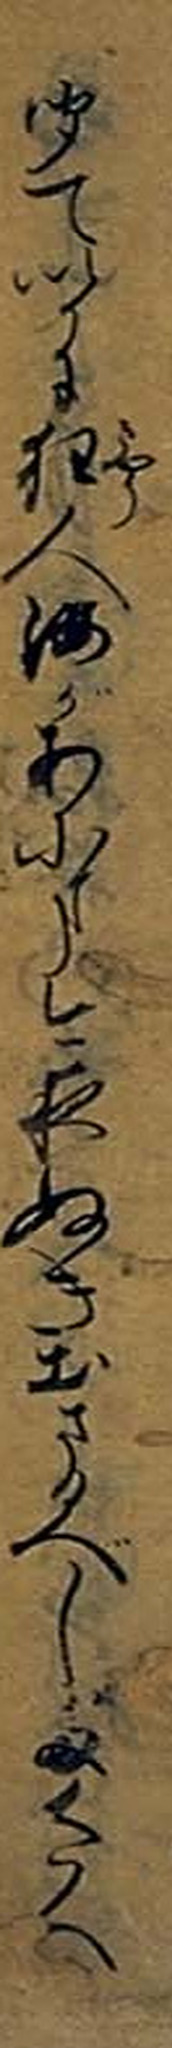聞ていかに狂人汝があにま今夜ぬき出さるべしたくはへ
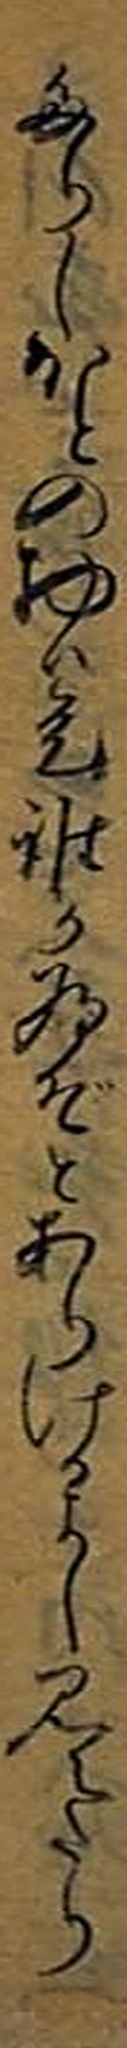たりしほとの物は是誰が為ぞとありけるよし見えたり
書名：ぎやどぺかどる
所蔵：東京大学総合図書館 / General Library in the University of Tokyo
